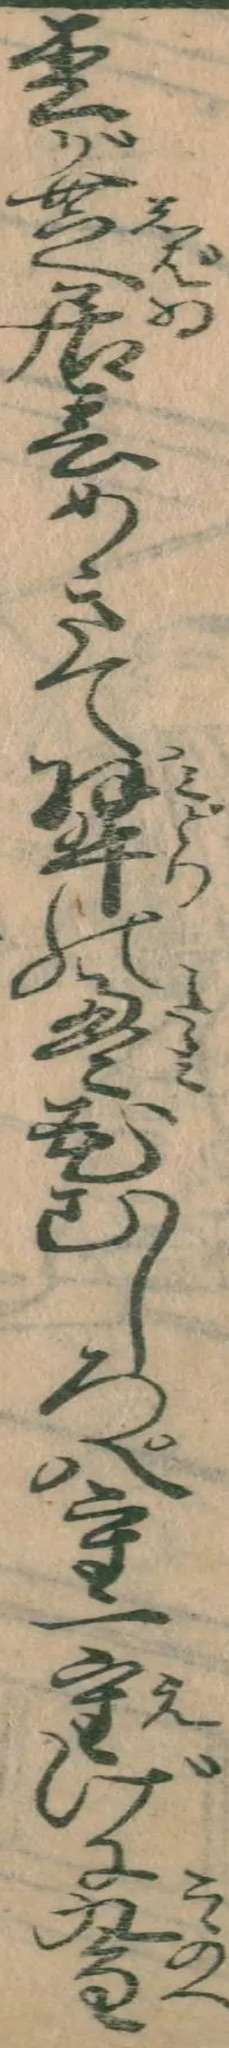松が芝居春めきて翠の畳花むしろ。八重一重げに九重
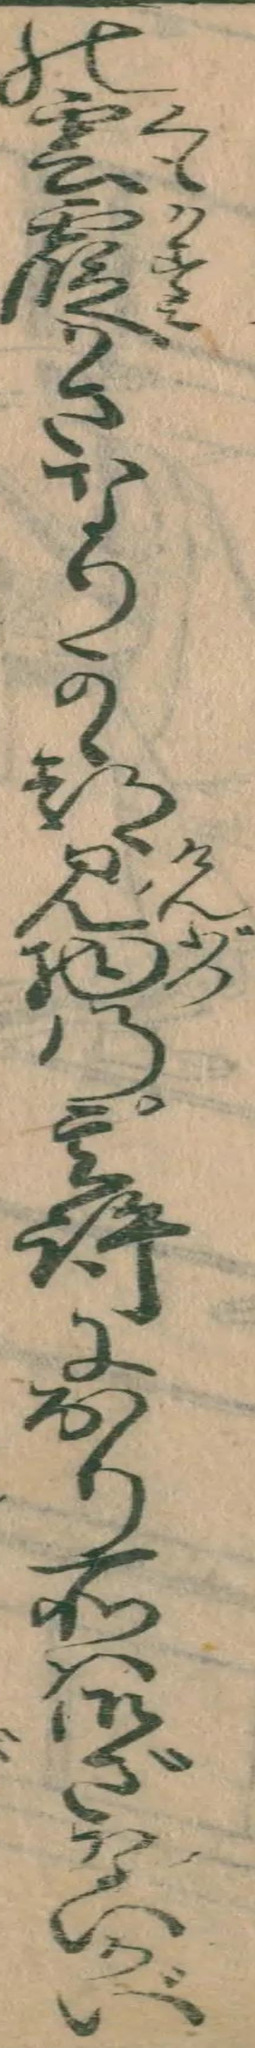の雲霞かさなりかゝる見物の。其許におり所は御ざないがい
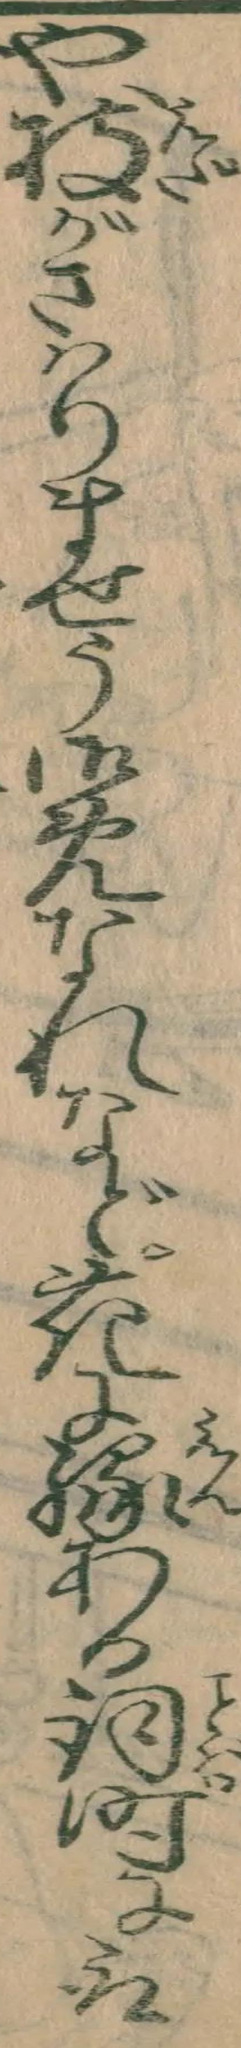や枝がさはりませう御免なれなど。花に縁ある詞。時に取
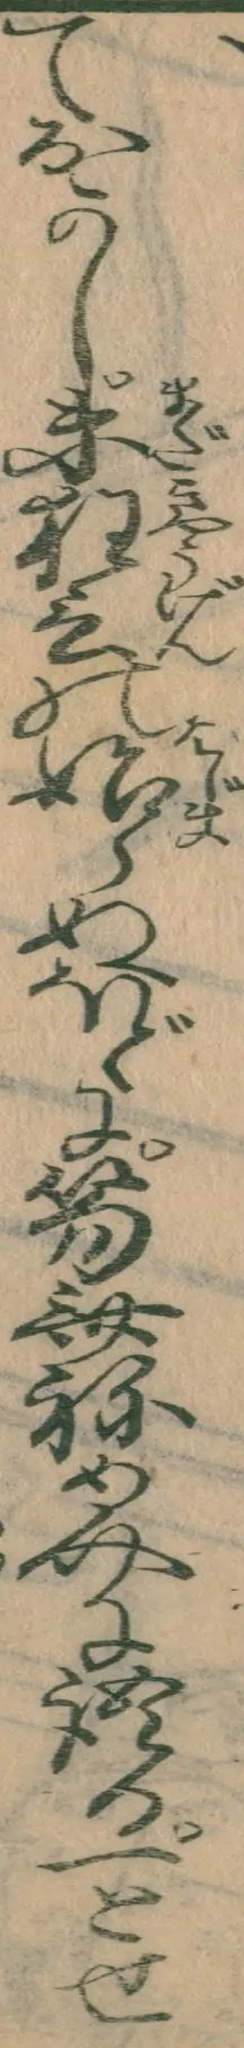ておかし。未狂言の始らぬほどに。筍斎ねめ介に語る。一とせ
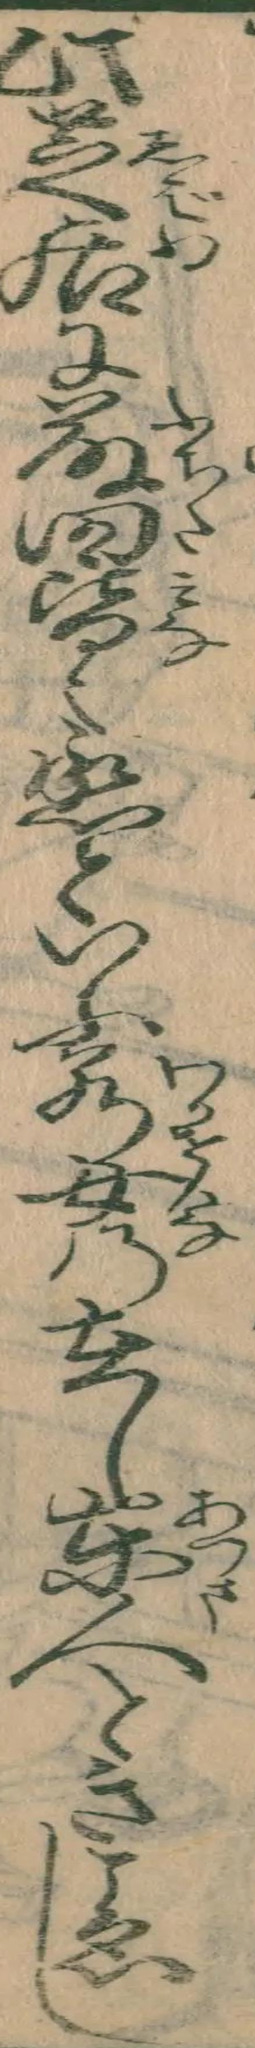此芝居に藤田皆之丞といふ若女の在し。東人ときこゑし
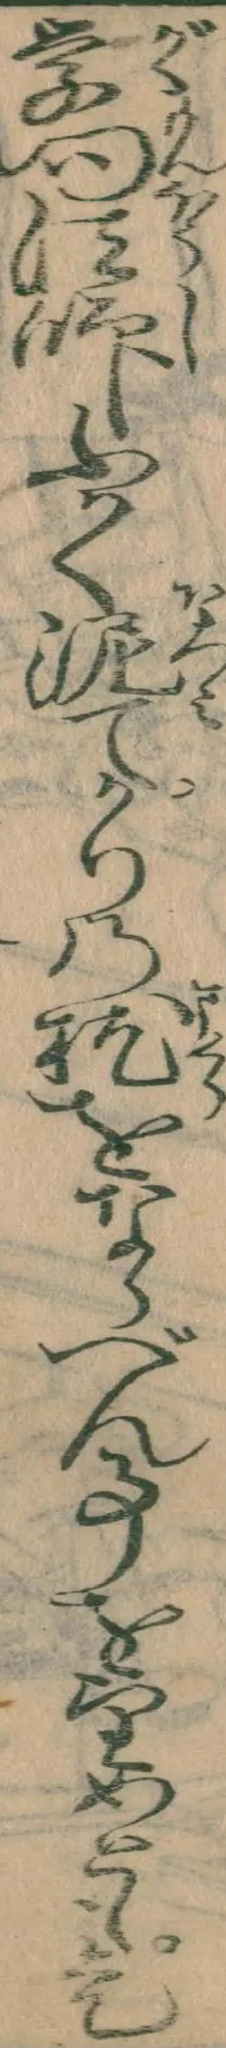学問法師ふかく泥て。かりの枕をならべん事を望めとも。是
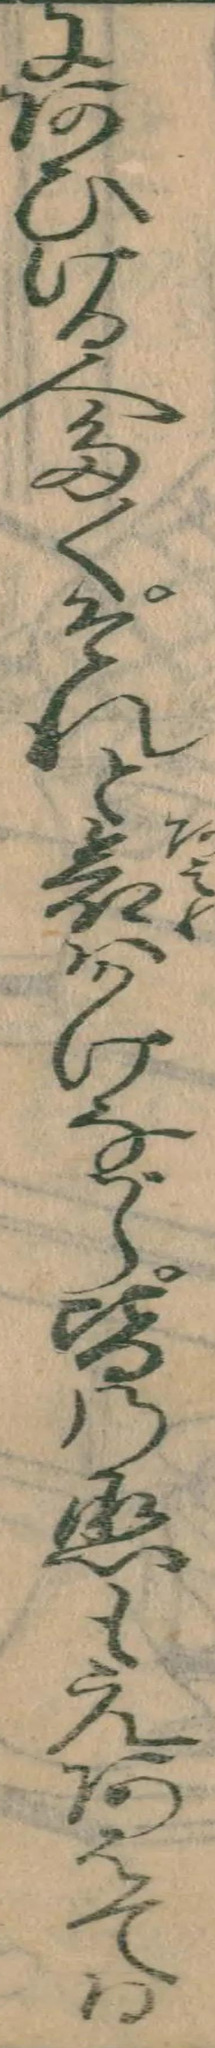にあひける人多〱。それと哀はかけながら。皆の丞もえあはて日
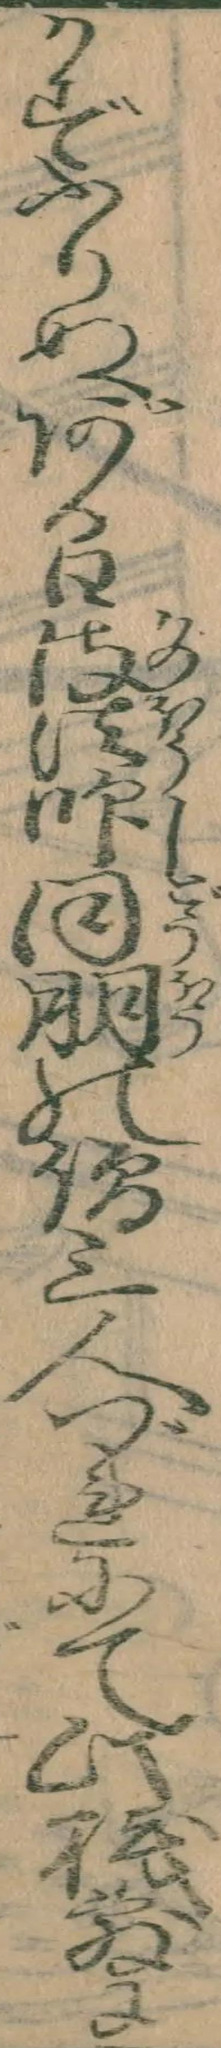かずふりぬ。ある日彼法師同朋の僧三人づれにて此桟敷に
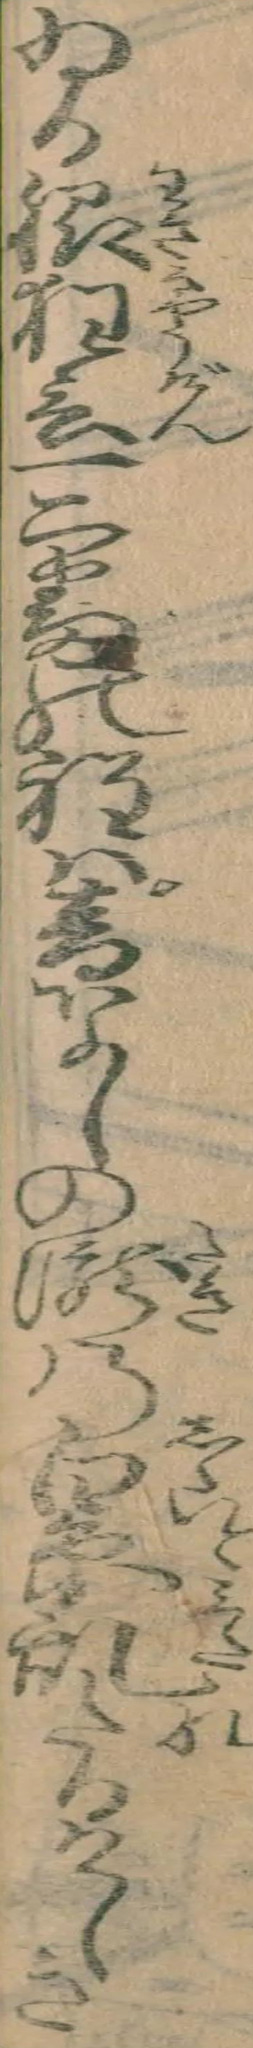ゐる脇狂言一二番の程は。音なしの滝の白糸乱たるけしき
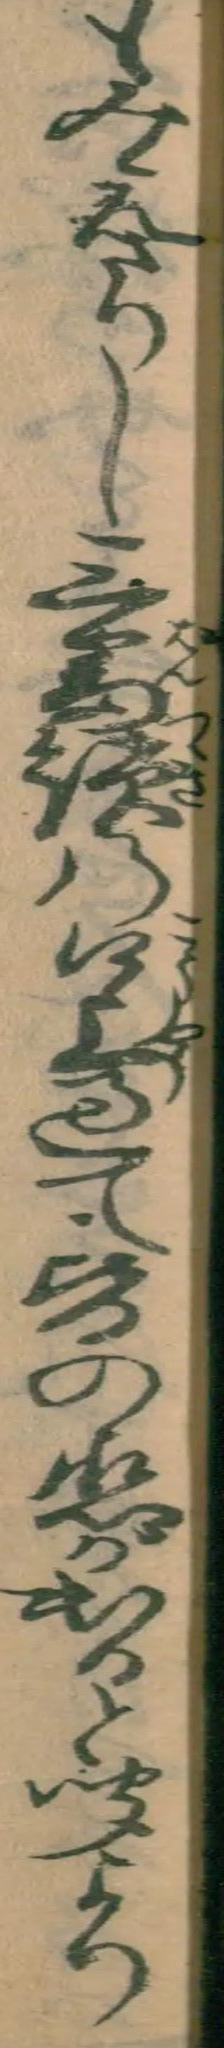もみえさりし三番続の口上過て皆の丞が出ると聞より
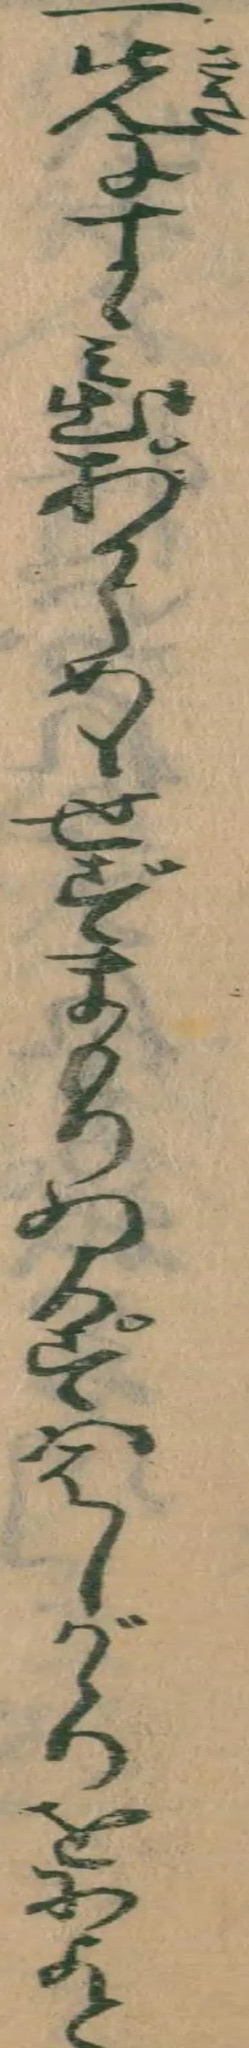一先にすゝみ出。あからめもせずまもりゐる。すははしがゝりをによと
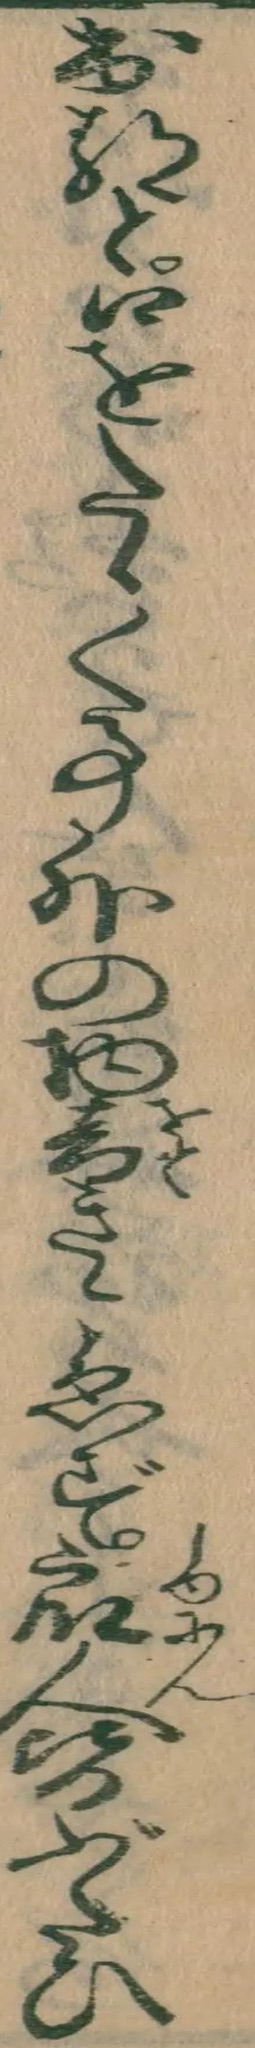出ると。口をたゝ〱事外の物音きゝゑず。衆人皆ぶたひ
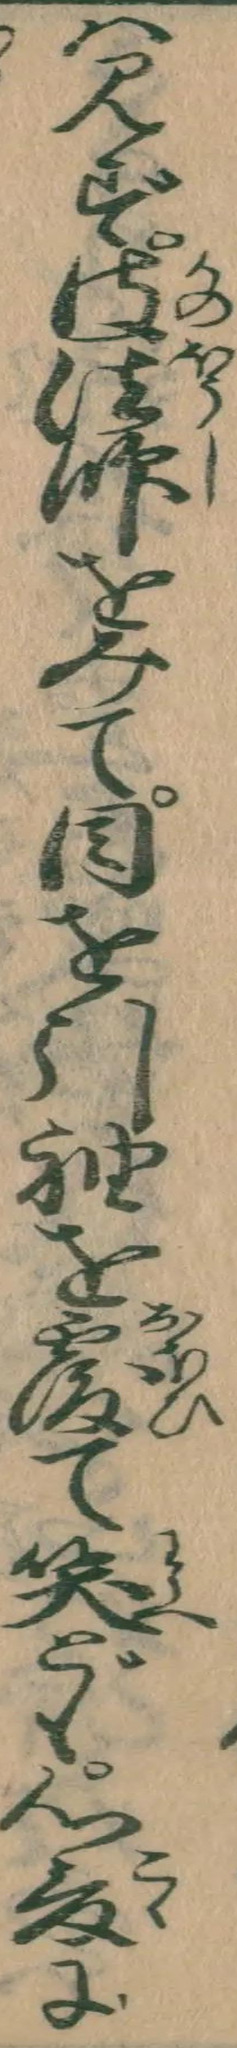は見ず。彼法師をみて。目を引袖を覆て笑ども。心爰に
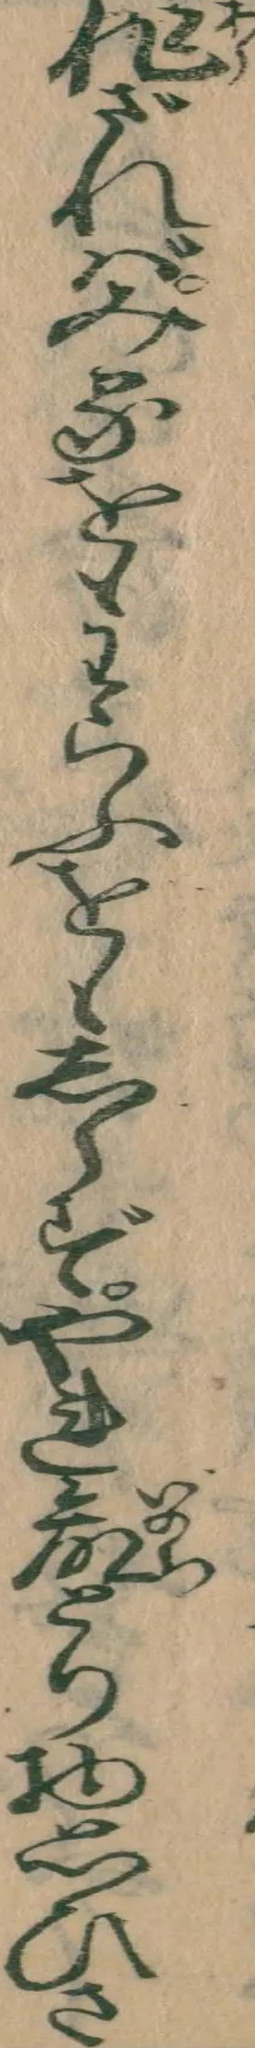非ざれば。みるをもわらふをもしらず。やれ命とり物思ひさ
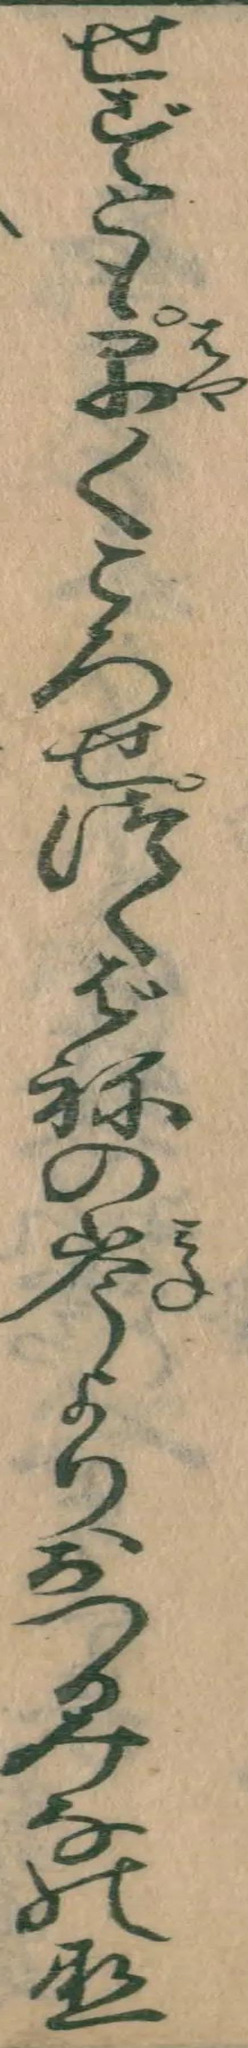せずとも。早くころせ。つくばねの峰よりおつるみなの丞
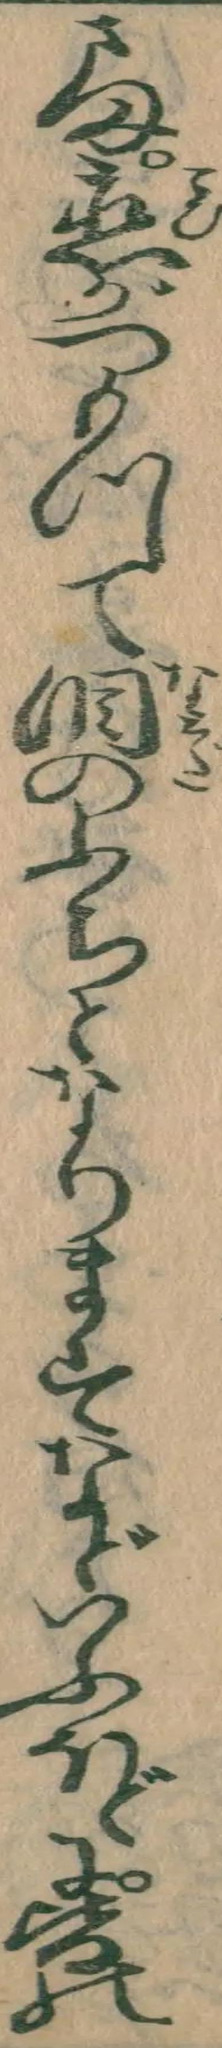さま。恋がつもつて泪のふちとなりますなどいふほどに。皆の
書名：新竹斎 5巻
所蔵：国立国会図書館 National Diet Library, JAPAN
